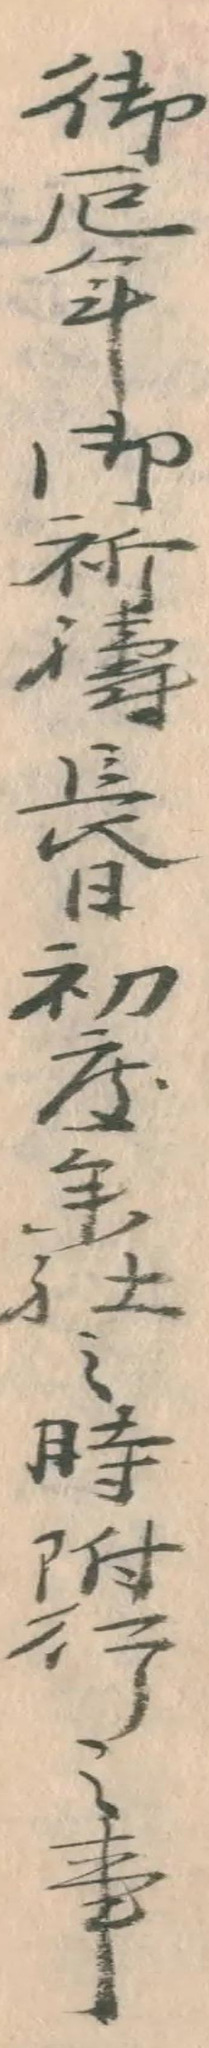一御厄年御祈祷長日初度参社之時附行之事
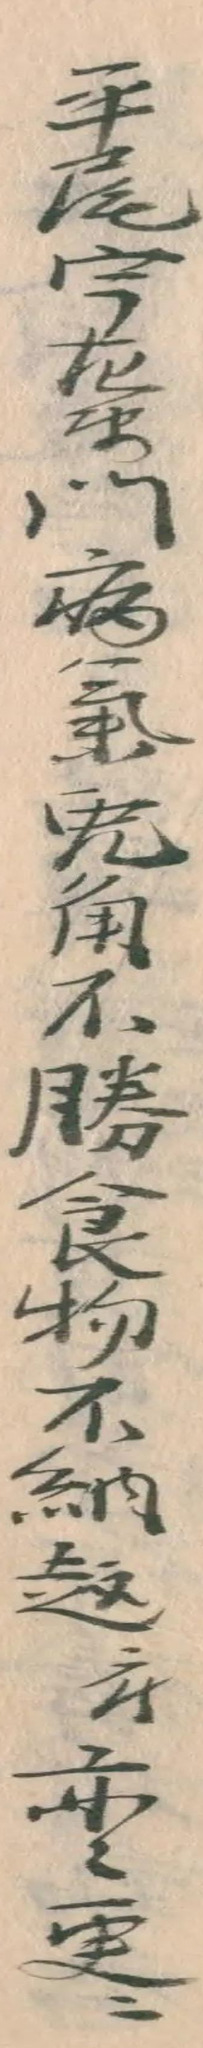一平尾宇左衛門病氣兎角不勝食物不納趣ニ付亦々更ニ
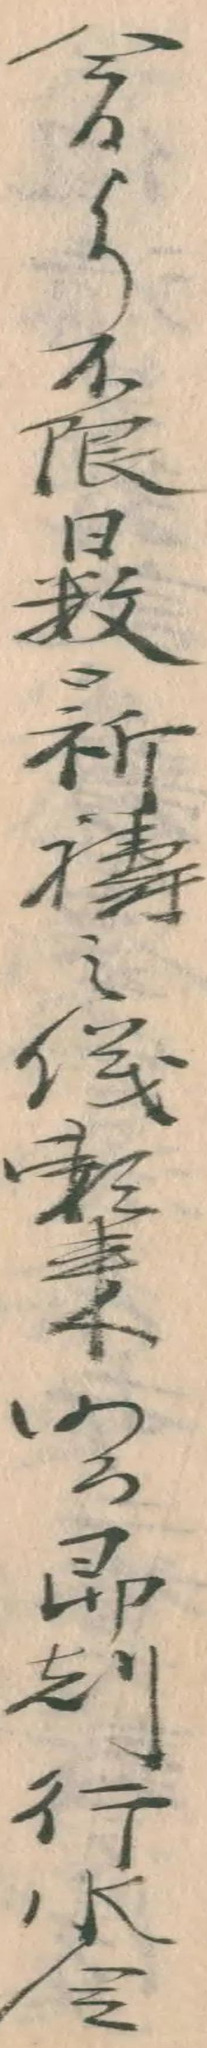今日より不限日数御祈祷之儀頼来仍而即刻行水令
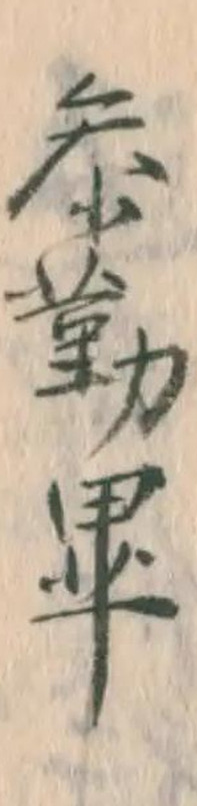参勤畢
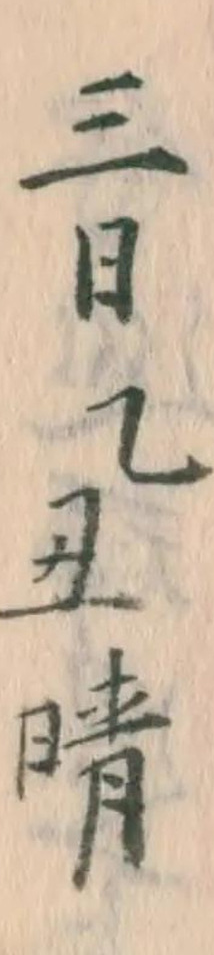三日乙丑晴
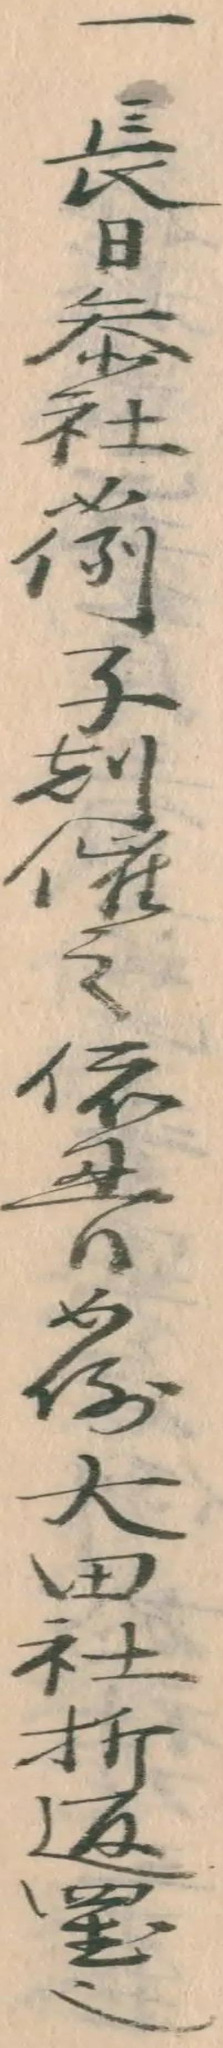一長日参社如例子刻催之依来日如例大田社折返置也
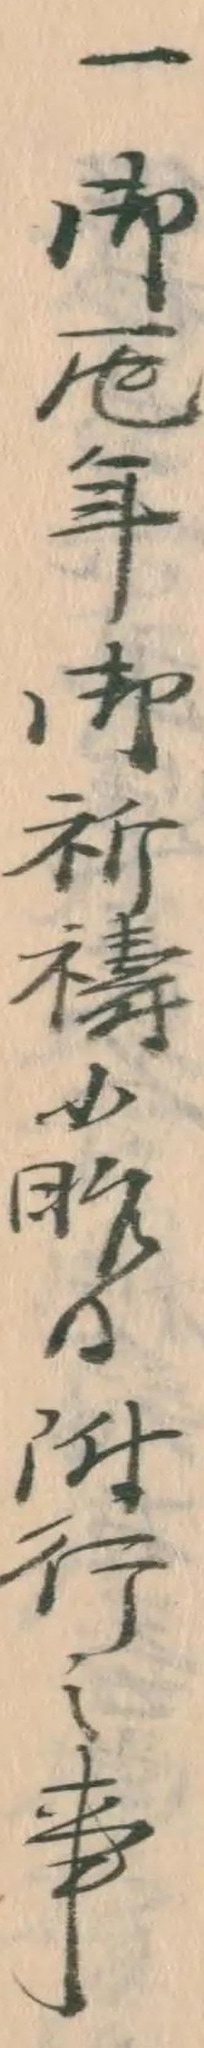一御厄年御祈祷如昨日附行之事
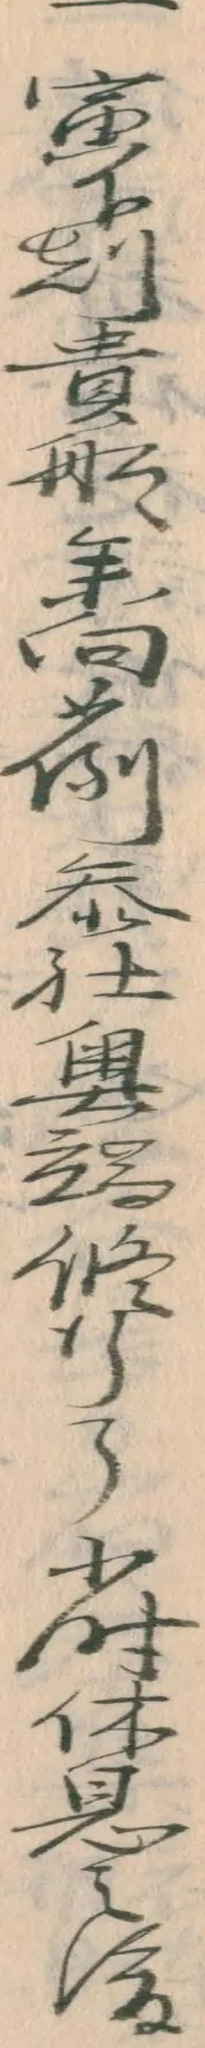一寅下刻責舩へ参向如例参社奥端修行了少時休息之後
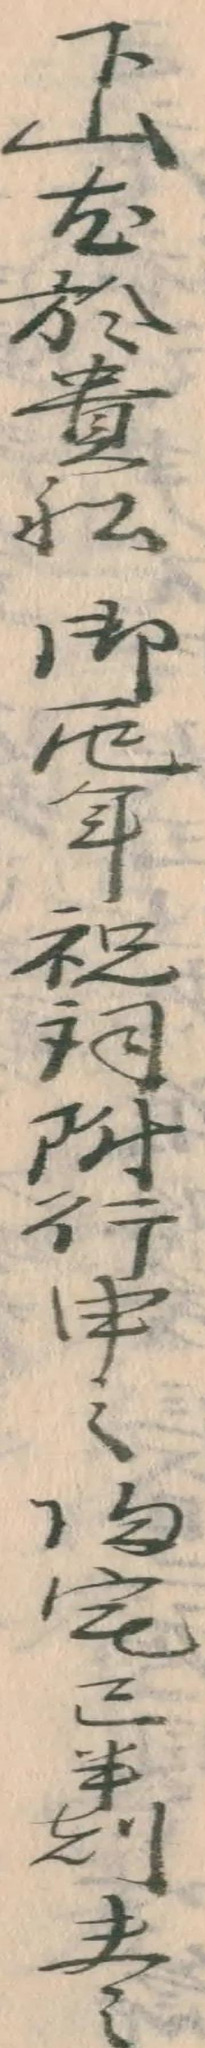下山尤於貴舩御厄年祝詞附行申之帰宅巳半刻夫之
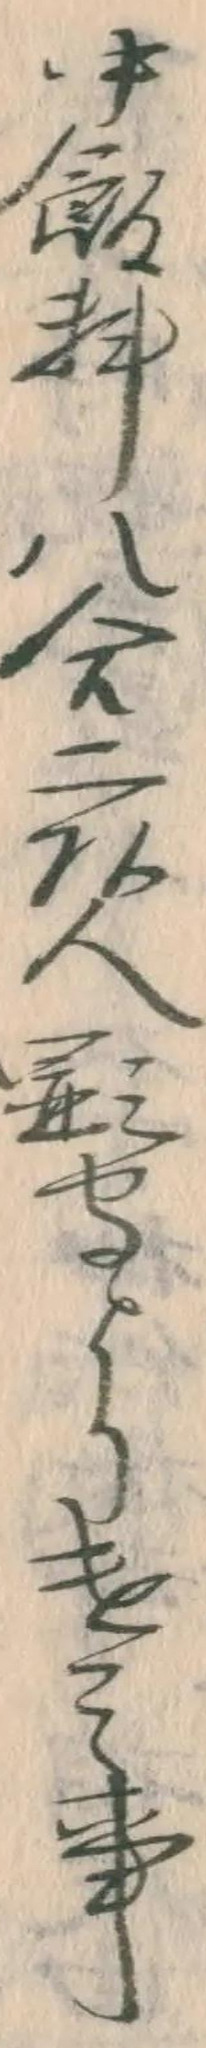中飯料八合二頭人顕守より遣之事
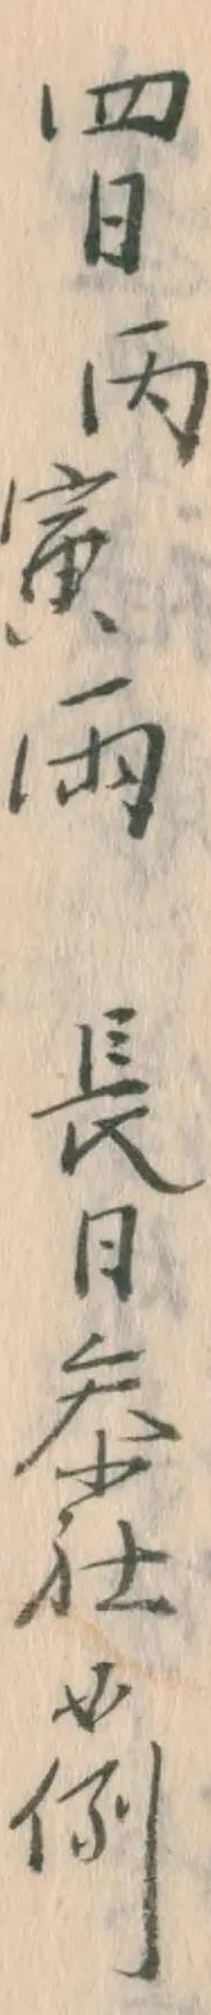四日丙寅雨長日参社如例
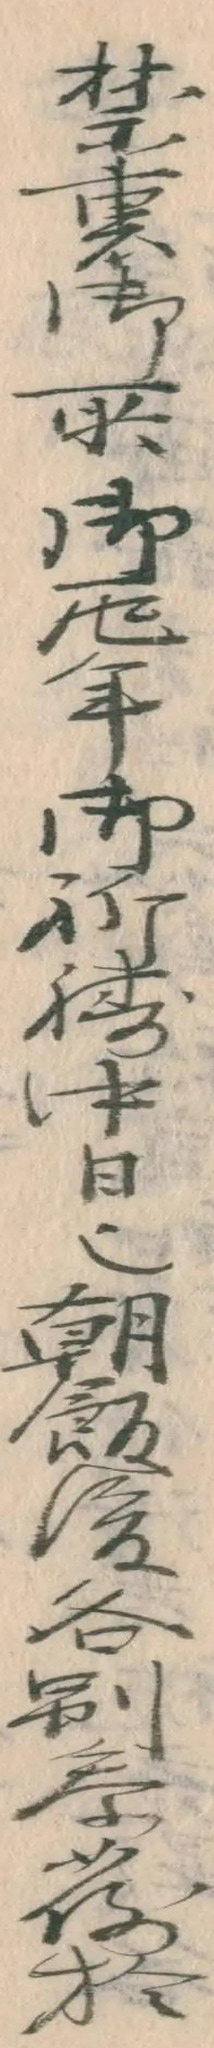一禁裏御所御厄年御祈祷中日也朝飯後各別参如例於
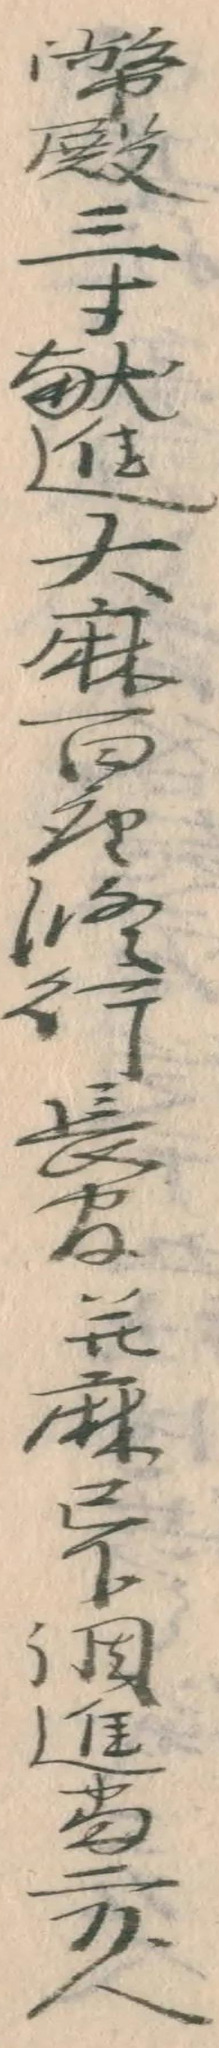幣殿三寸献進大麻百座修行長官并麻已下調進両二頭人
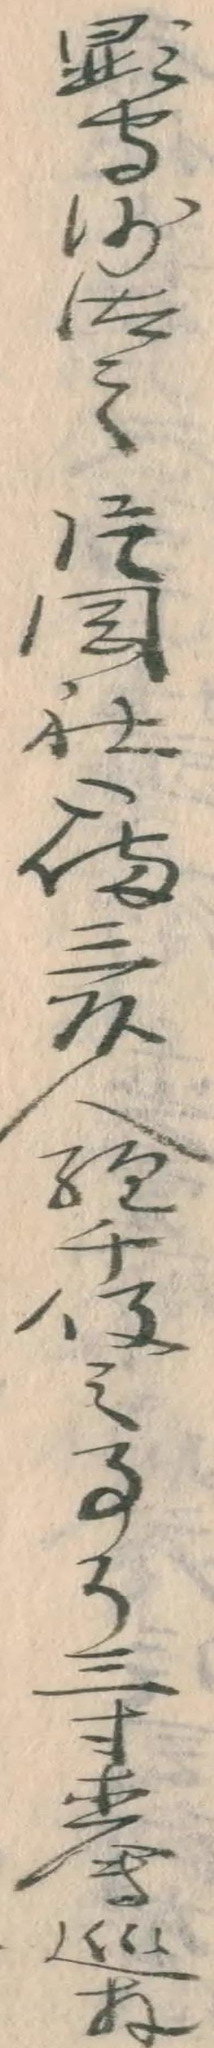顕守沙汰之片岡社御備三頭人経千役之事了三寸直會巡拝退下
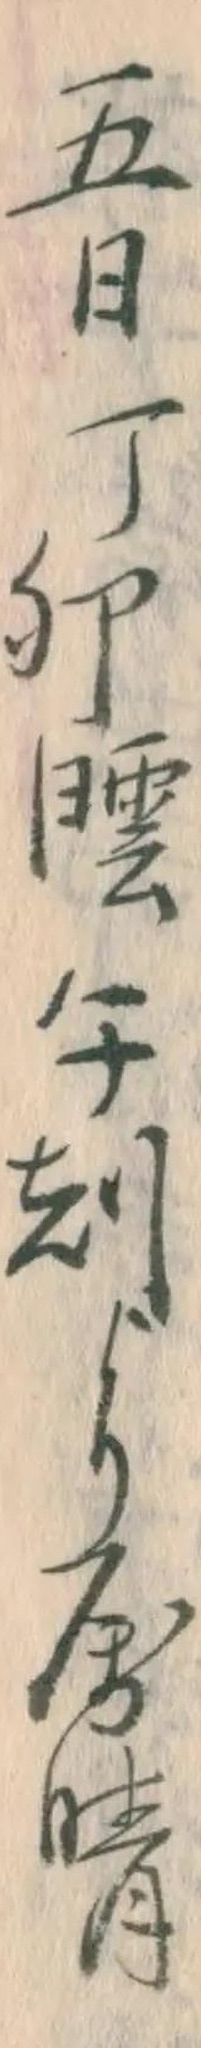五日丁卯雲午刻より属晴
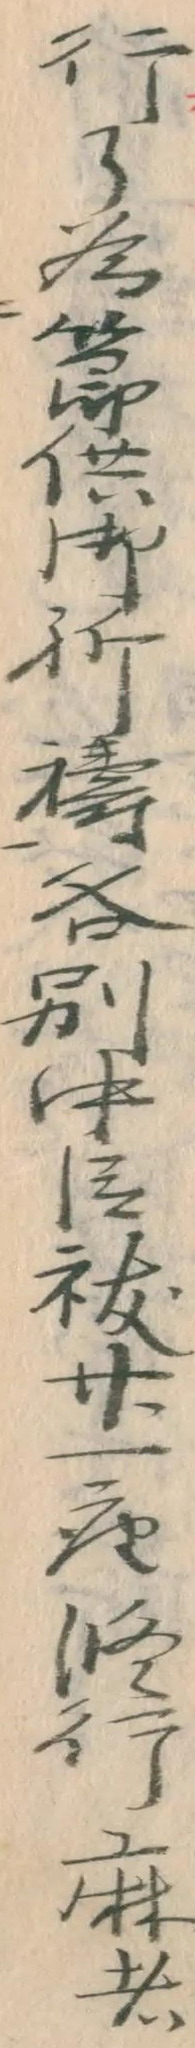行了為節供御祈祷各別中臣祓廿一座修行麻者
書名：賀茂社記録. 第73冊
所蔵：国立国会図書館 National Diet Library, JAPAN
